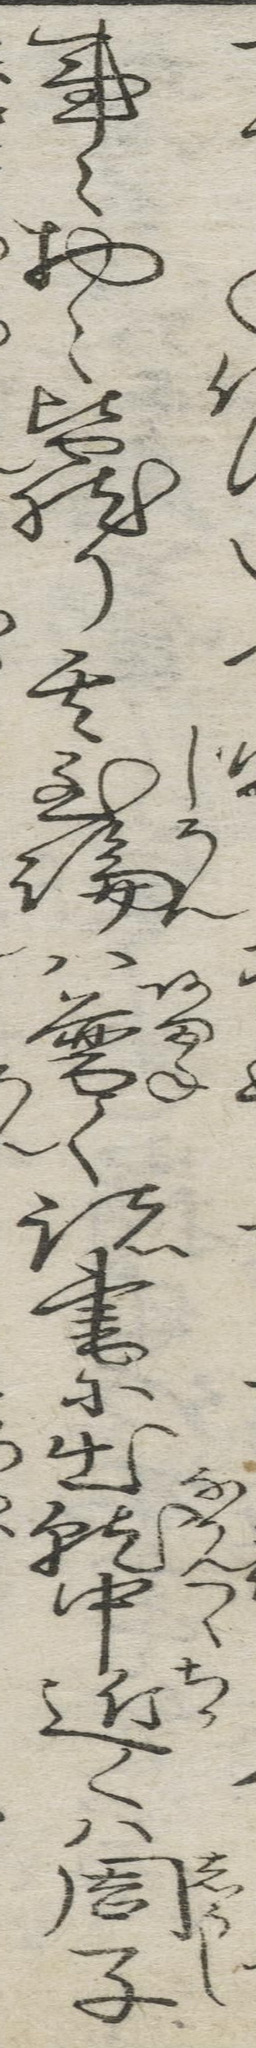事〻物〻皆然り其至論は普く誌書に出就中近くは周子
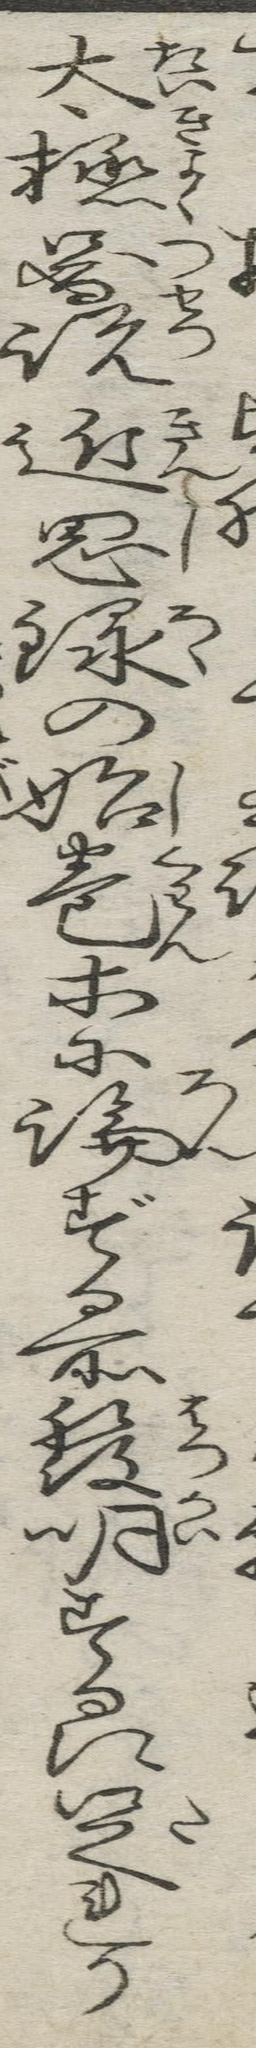太極圖説近思録の始巻等に論ずる所発明するに是れり
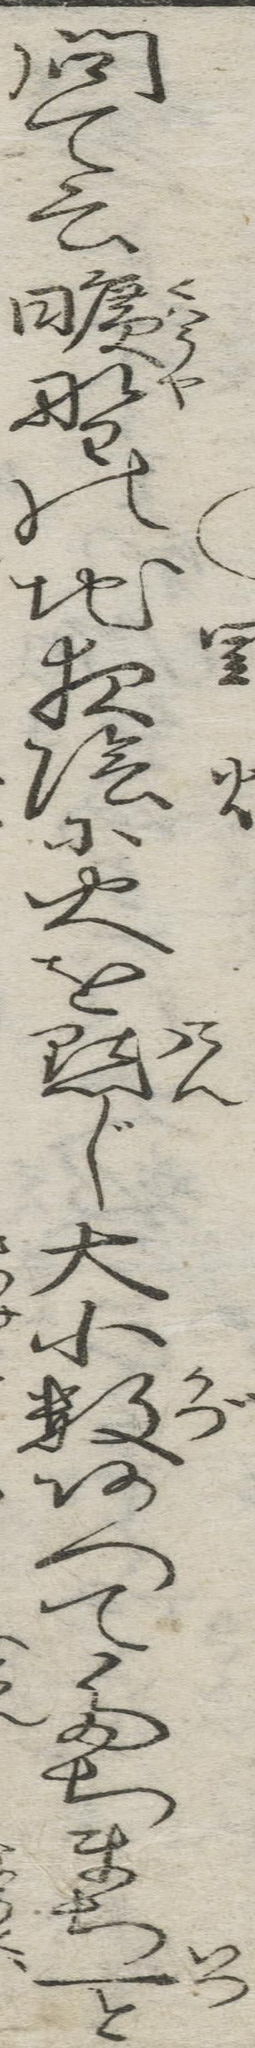問て云曠野の地夜陰に火を點じ大小数あつてたちまち一と
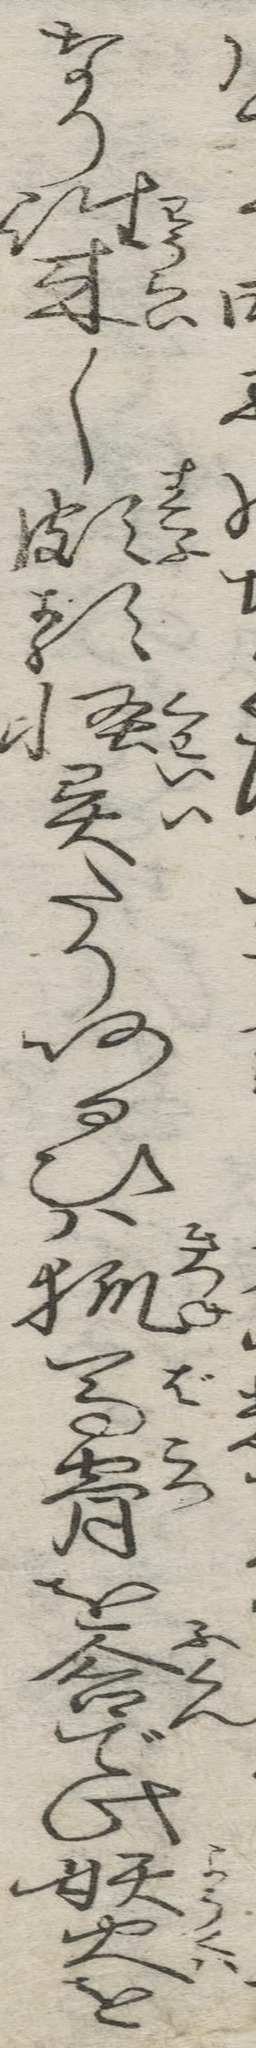なり往来し頗る怪異たりあるひは狐馬骨を含で此妖火を
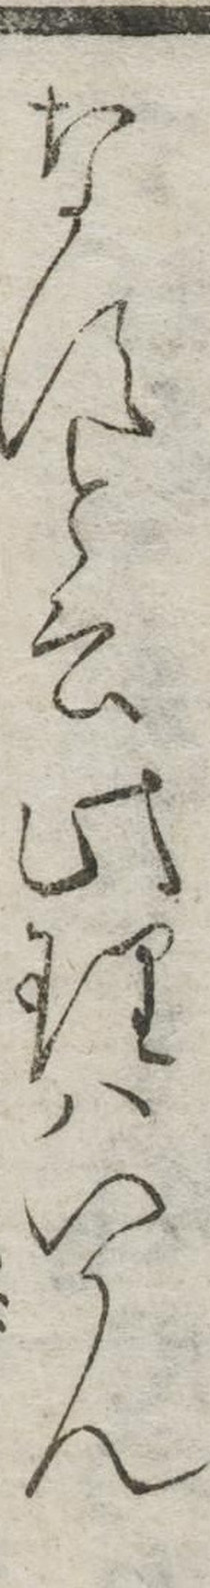なすと云此理はいかん
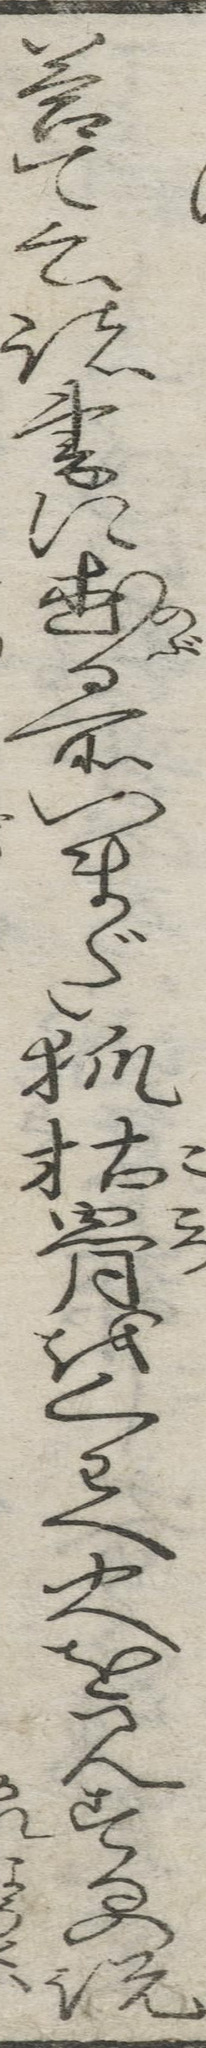答て云誌書に述る所いまだ狐枯骨をくわへ火を見するの説
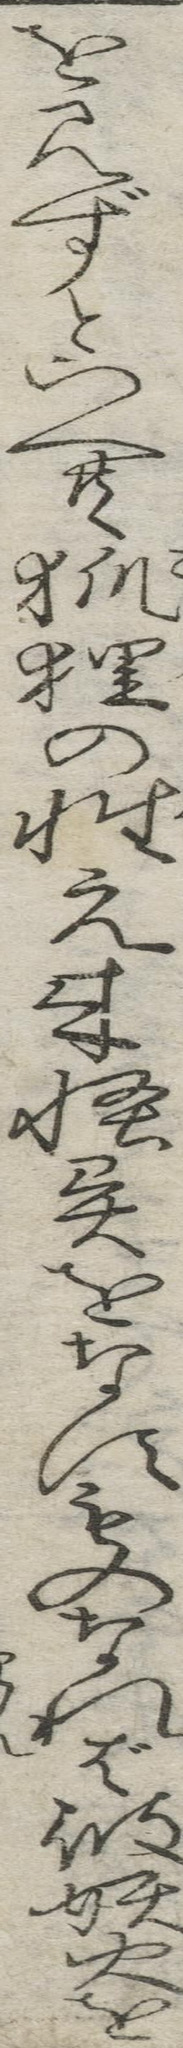を見ずといへども狐狸の性元来怪異をなすものなれば彼妖火を
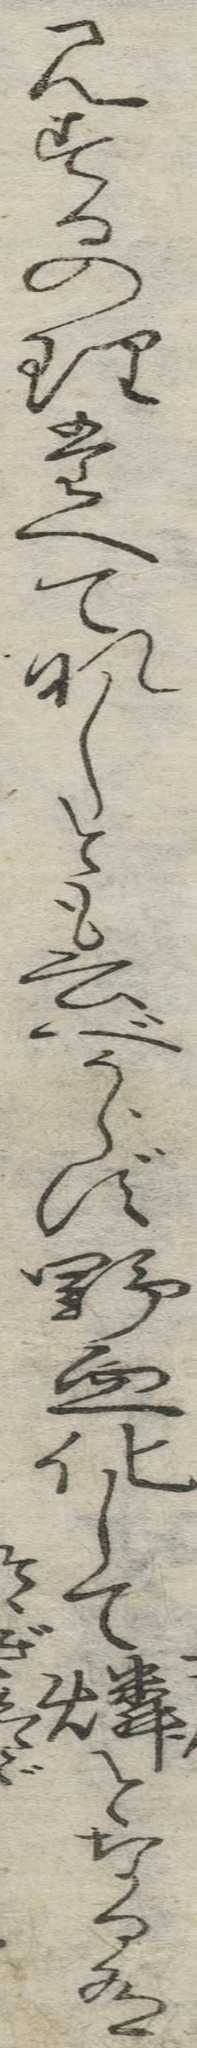見するの理たへてなしとも云べからず野血化して燐となる有
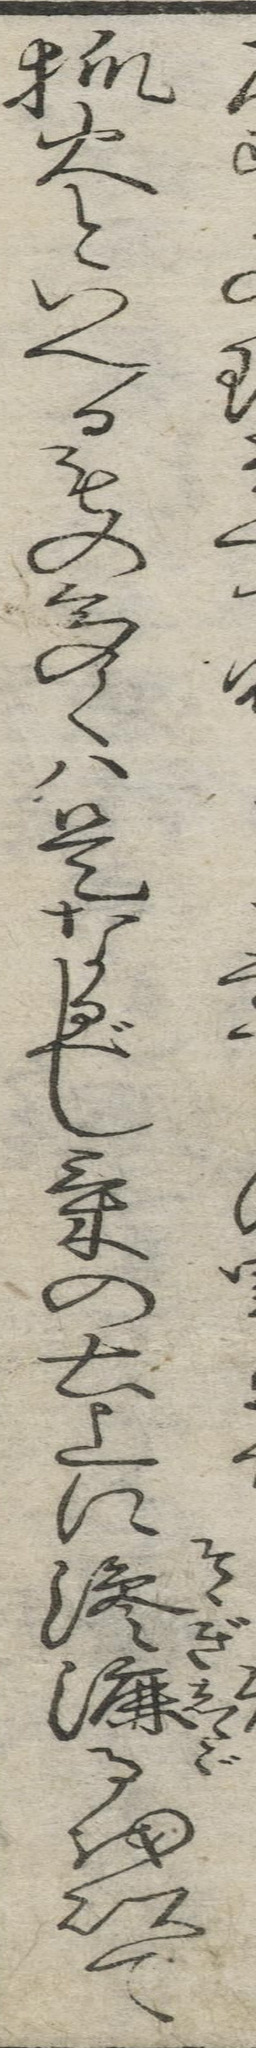狐火といへるもの多くは是なるべし気の土上に渗濂るを以て

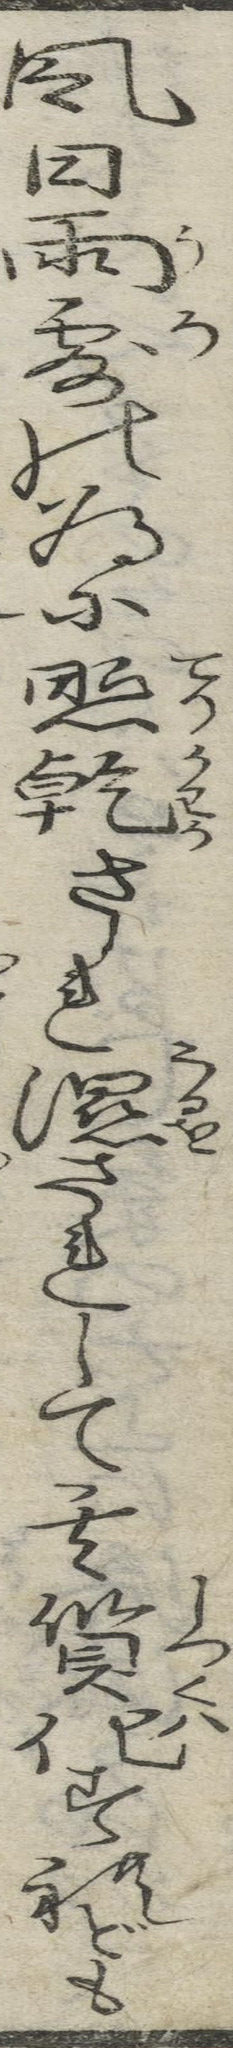風日雨香の為に照乾され湿されして其質化すれども
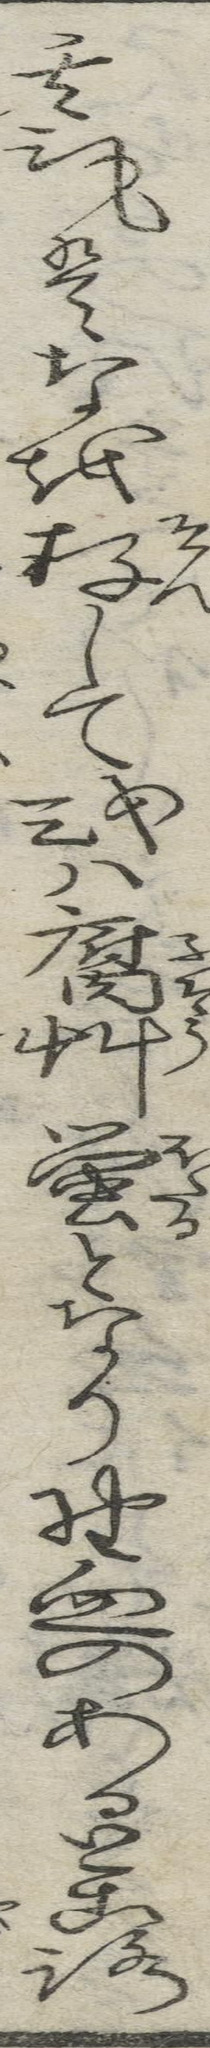其気はなを存して或は腐艸蛍となり生血のあるところ
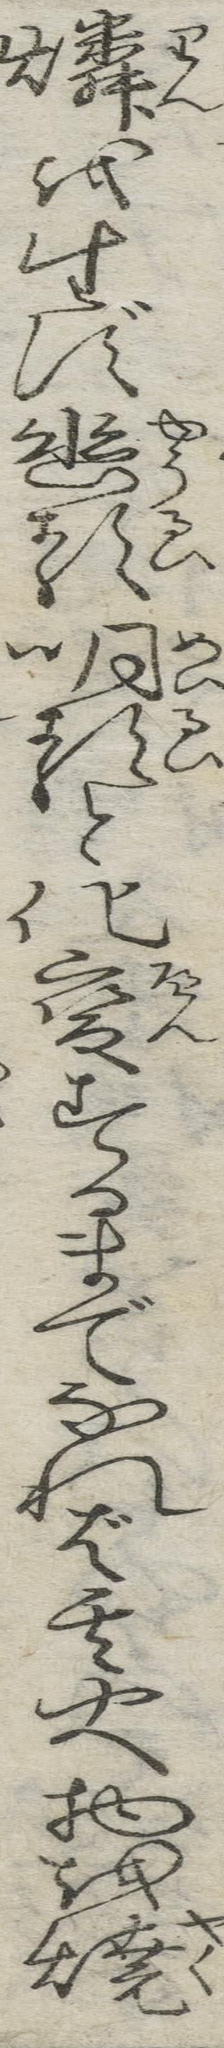燐を生ず幽類明類と化変するまでなれば其火物を焼
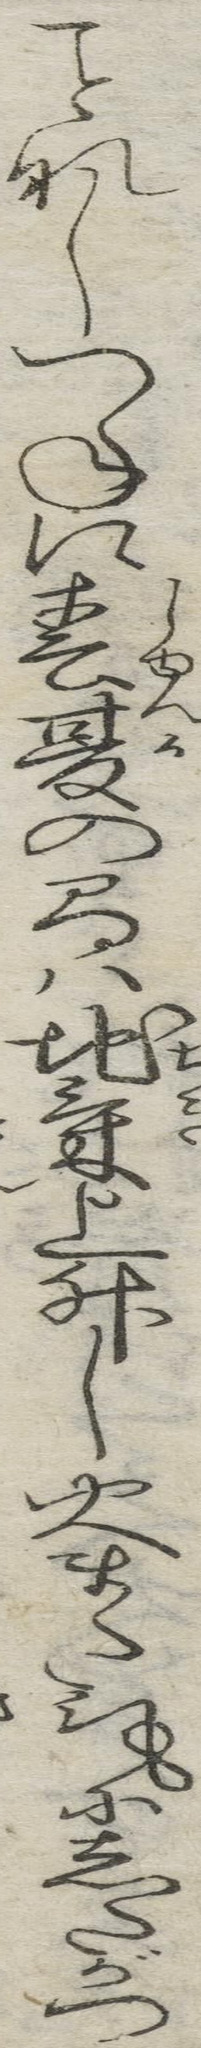ことなしつねに春夏の間は地気上昇し火また気にしたがつ
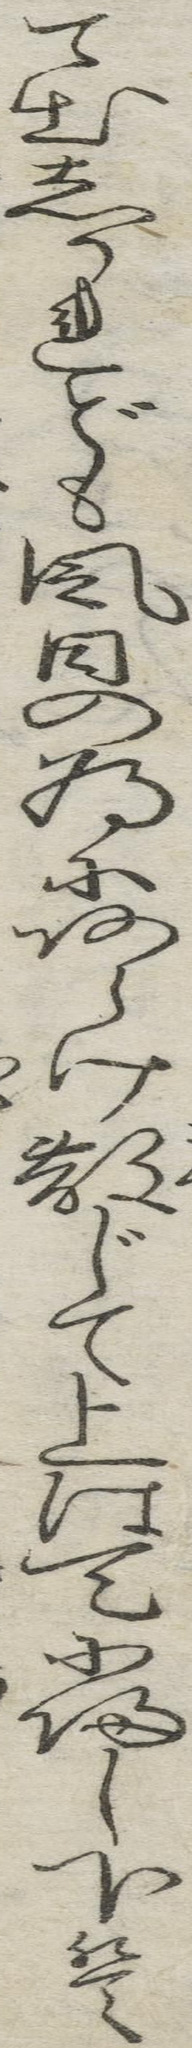て出しかれども風日の為にあらけ散じて上は天に偽し下は
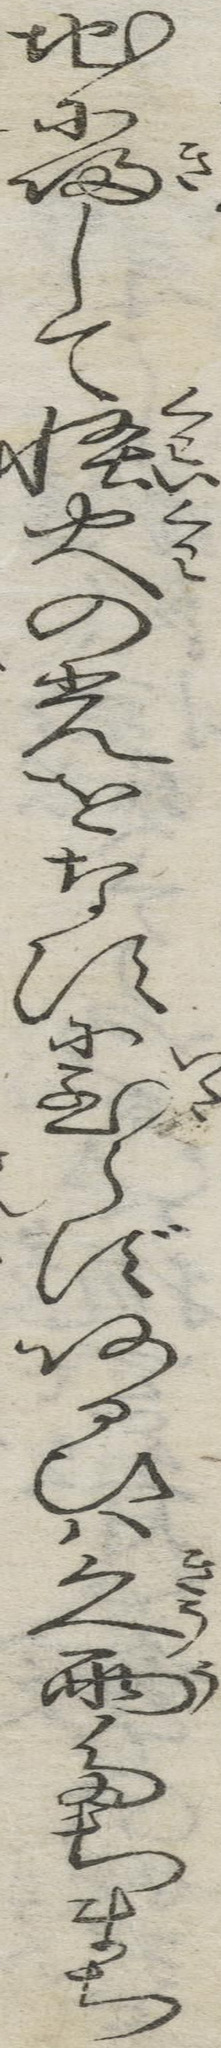地に偽して怪火の光をなすに至らずあるひは久雨たちまち
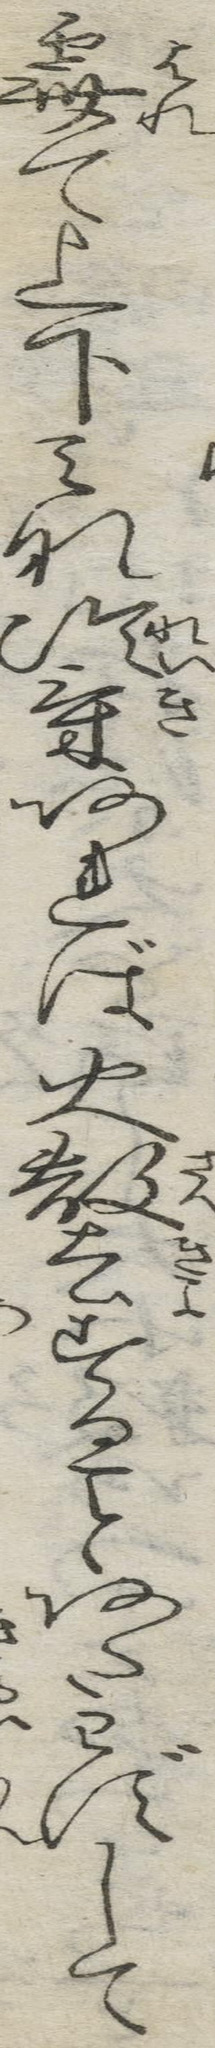霽て上下みな冷気あれば火散去することあたわずして
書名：訓蒙天地辨　地
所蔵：東京大学地震研究所図書室 Earthquake Research Institute Library, The University of Tokyo, JAPAN
